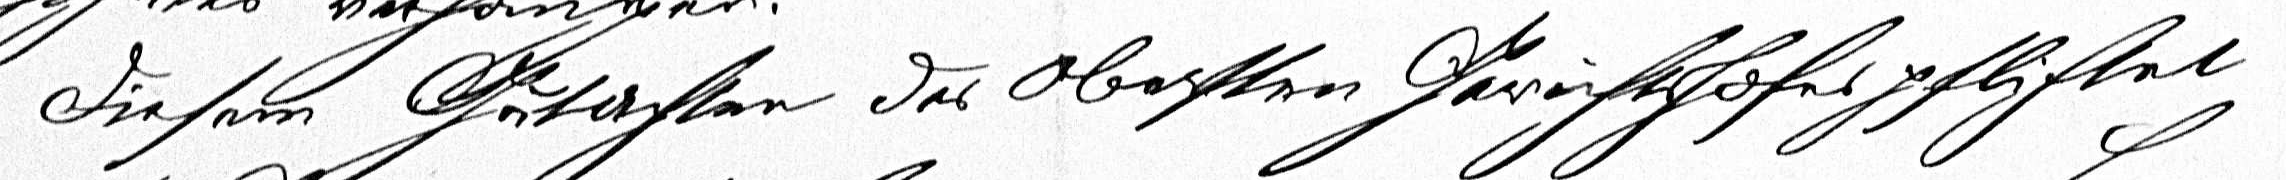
Diesem Gutachten der Obersten Gerichtshofes pflichtet
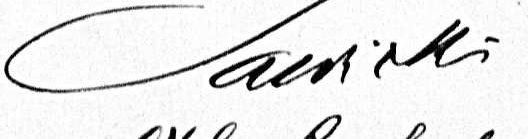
Sawicki
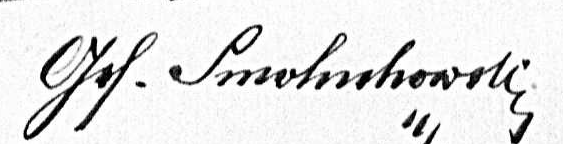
Ges. Smoluchowski
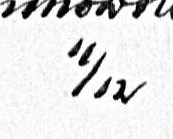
11/12
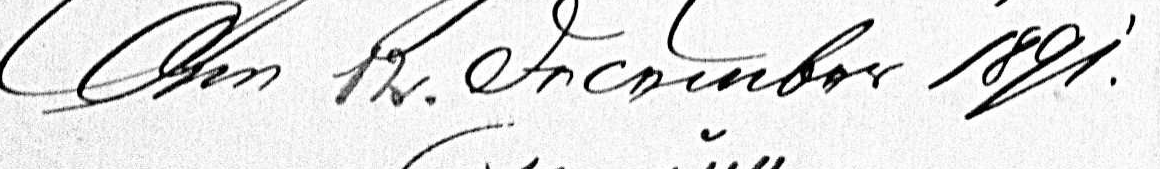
Am 12. December 1891
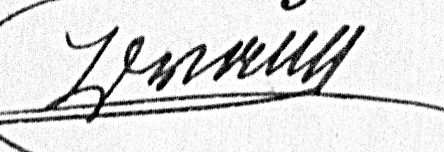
Braun
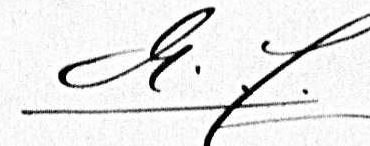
A E
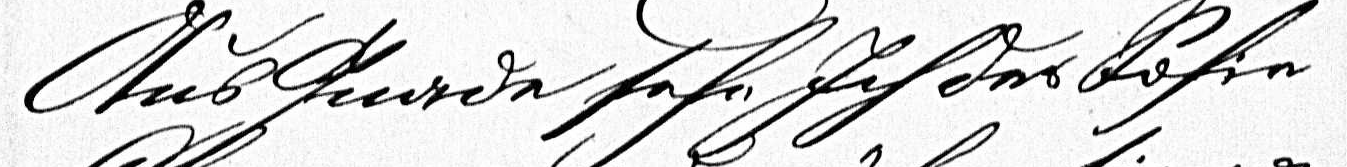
Aus Gnade sehe Ich der Sofie
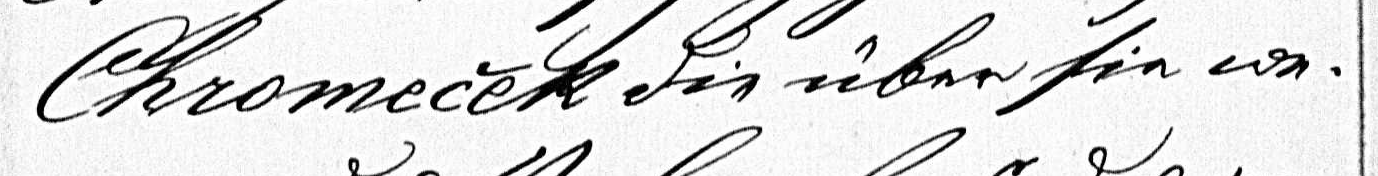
Chromeček die über sie we¬
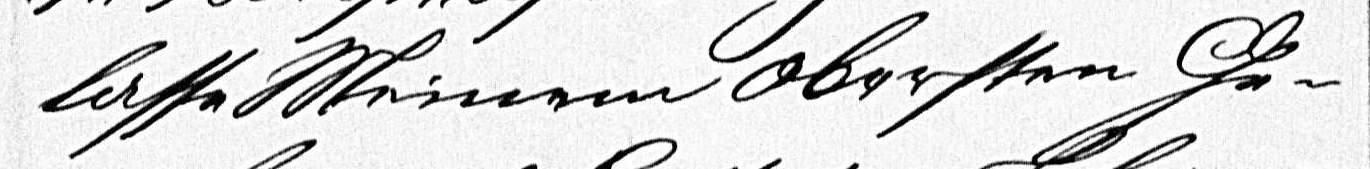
lasse Meinem Obersten Ge¬
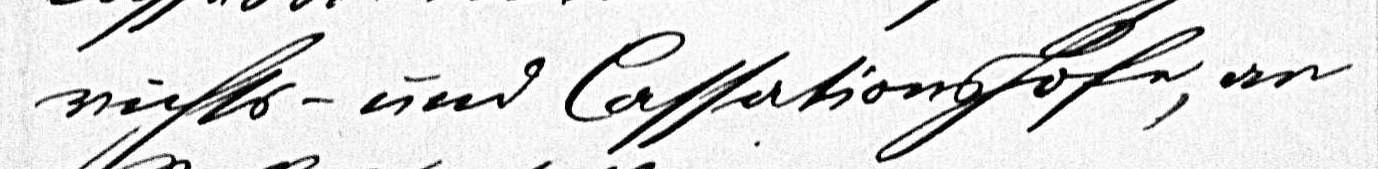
richts- und Cassationshofe, an
